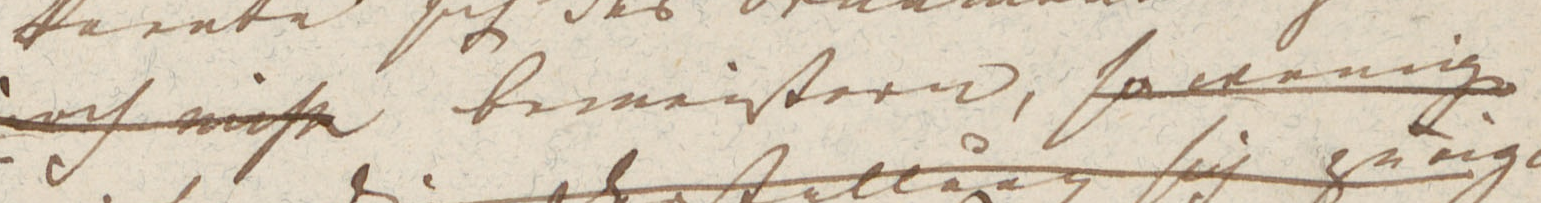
ncoh nicht bemeistern, so wenig
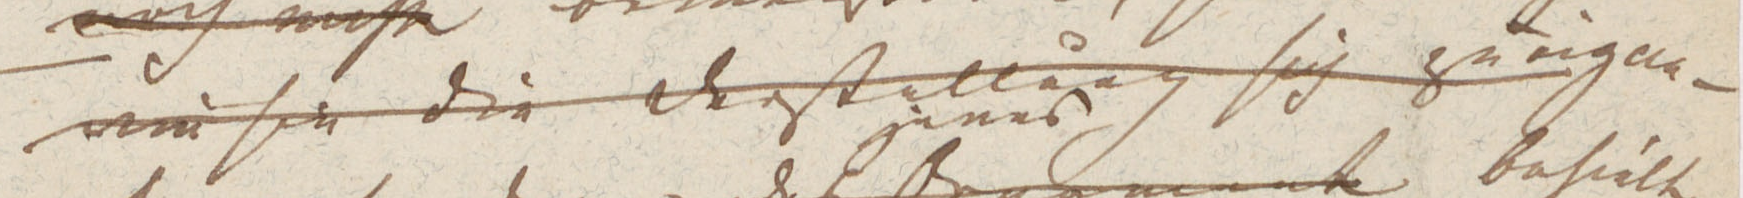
wie sie die Darstellung sich zu eigne-
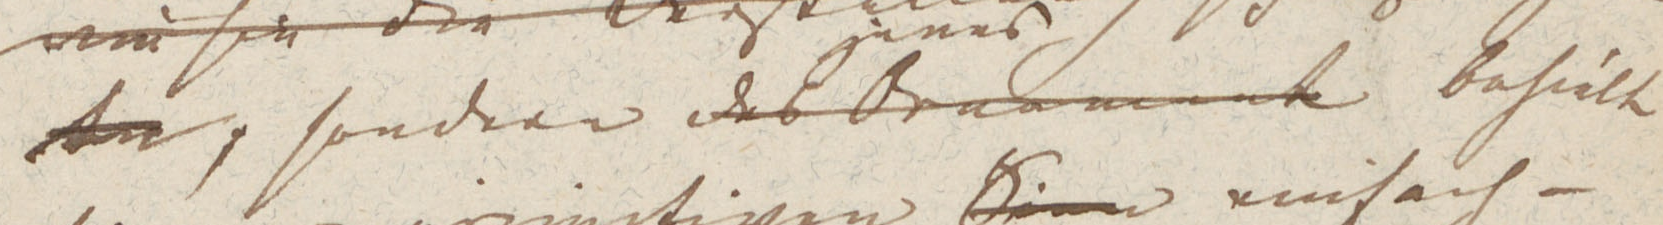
te, sondern das Ornament jenes behielt
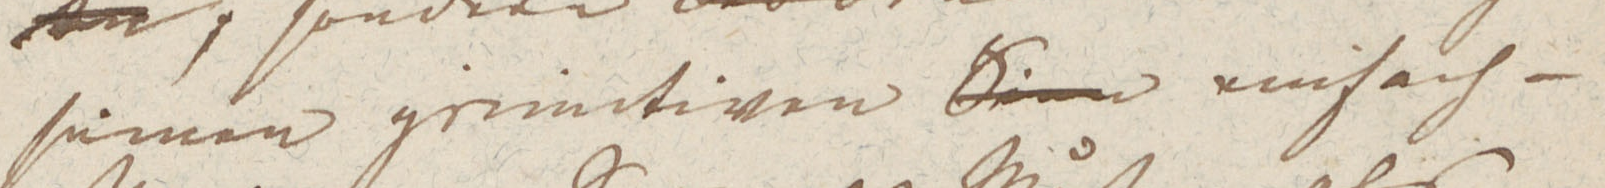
seinen primitiven Sinn einfach-
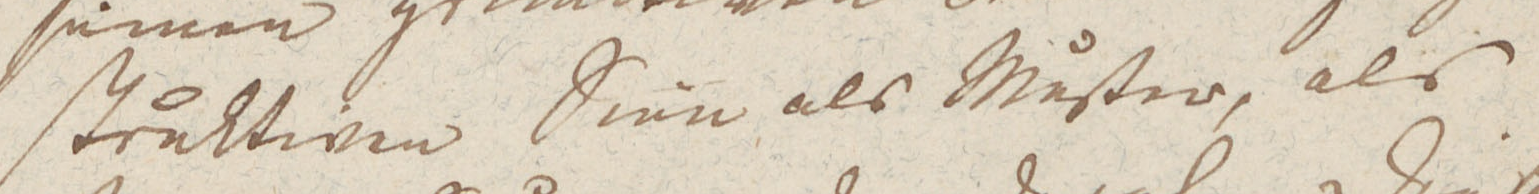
struktiven Sinn als Muster, als
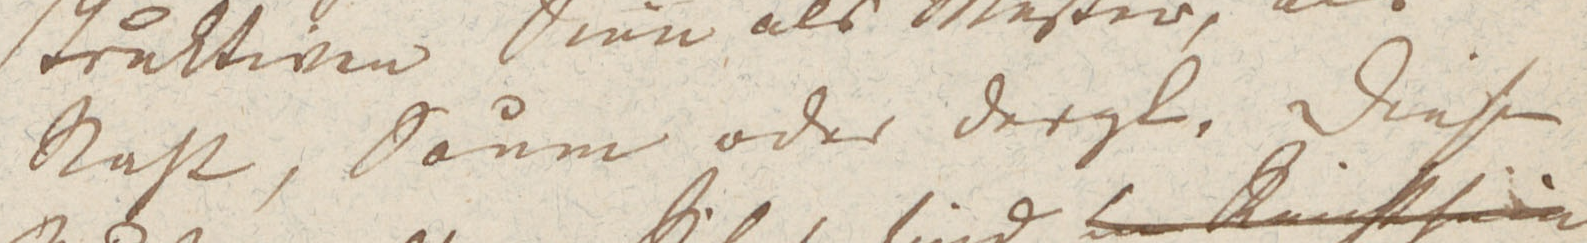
Naht, Saum oder dergl. Diese
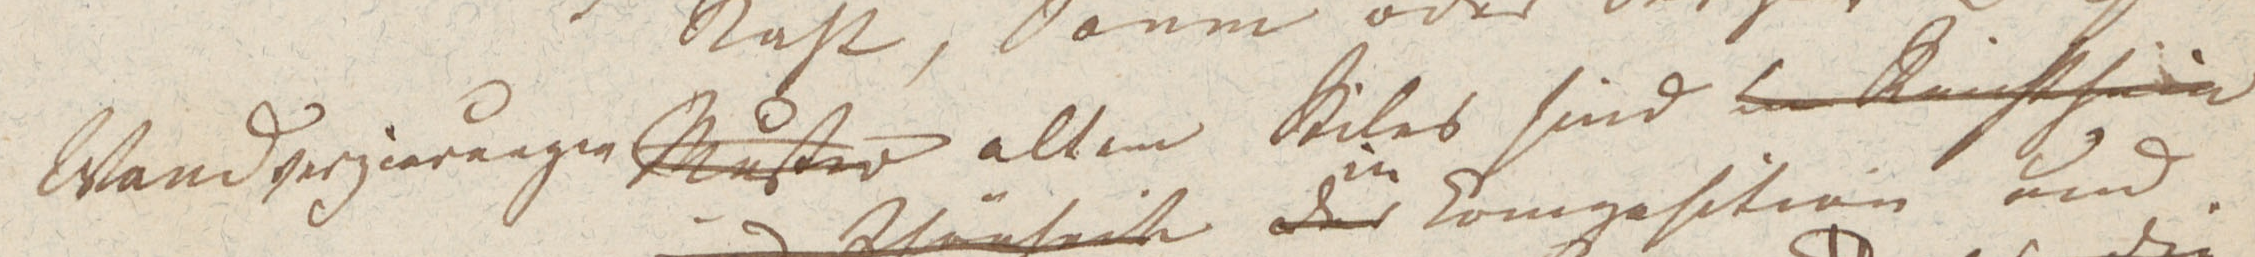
Wandverzierungen Muster altem Stiles sind in Reichthum
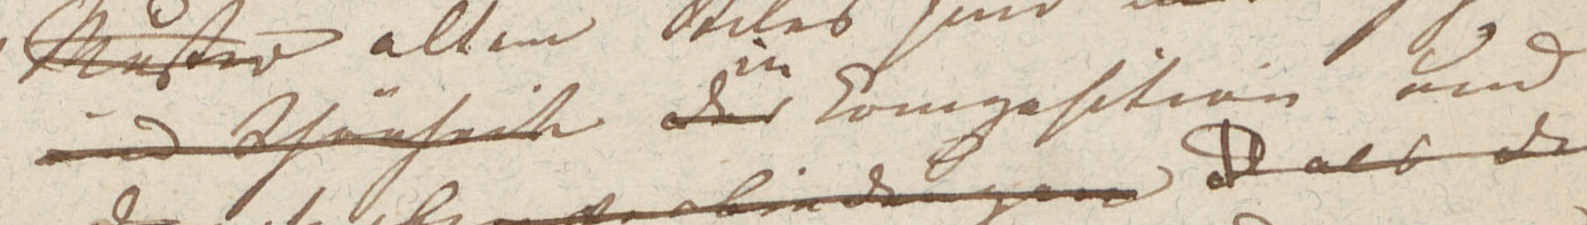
und Schönheit der in Composition und
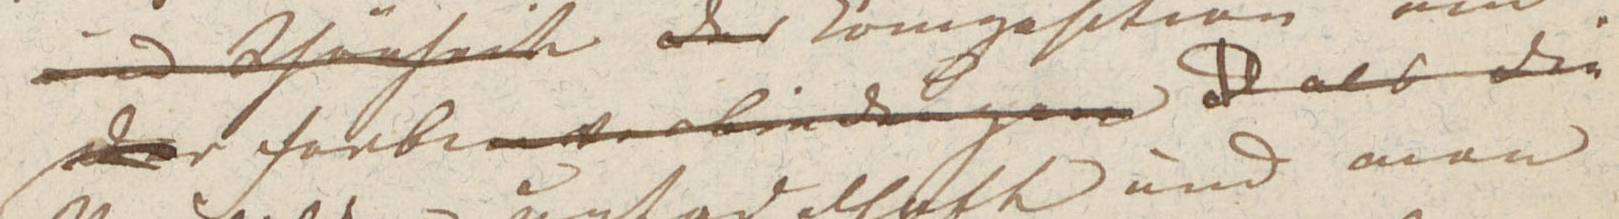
der Farbenverbindungen d als die
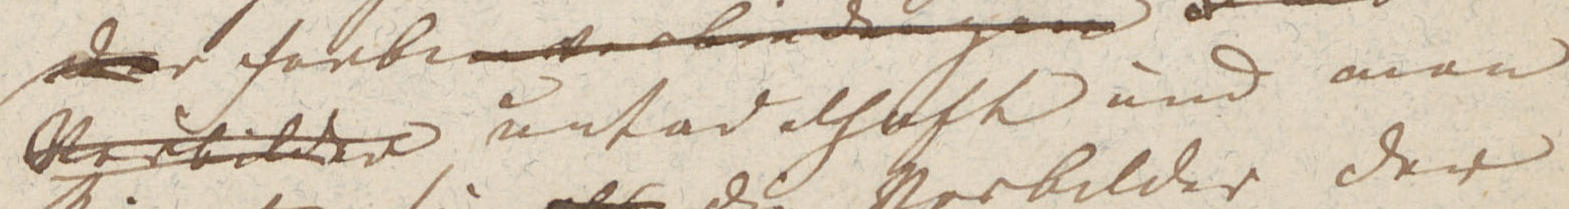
Vorbilder untadelhaft und man
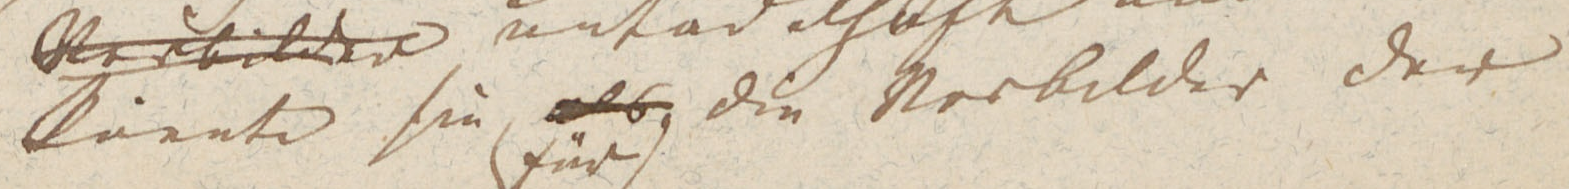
könnte sie als für die Vorbilder der
